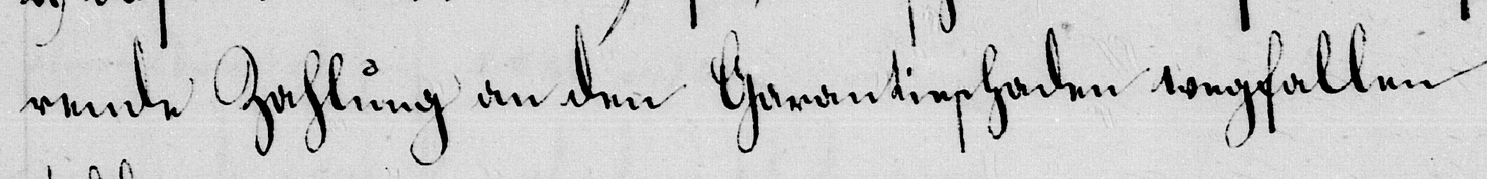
rende Zahlung an den Garantieschaden wegfallen
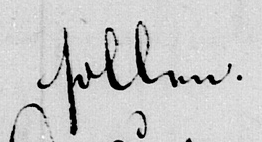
sollen.
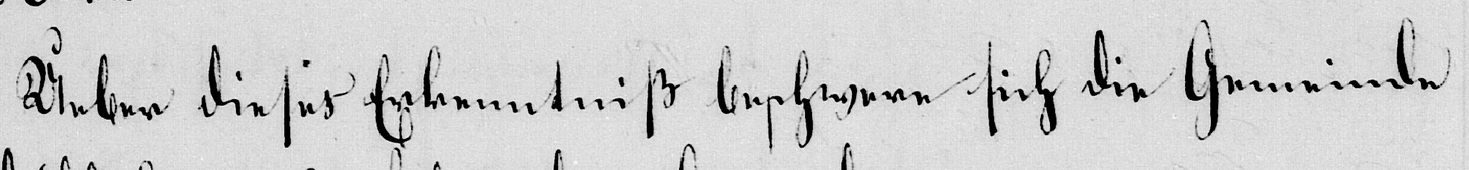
Ueber dieses Erkenntniß beschwere sich die Gemeinde
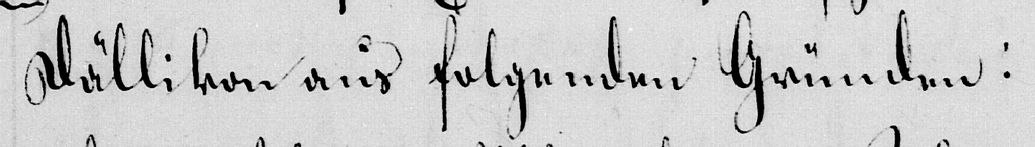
Dällikon aus folgenden Gründen:
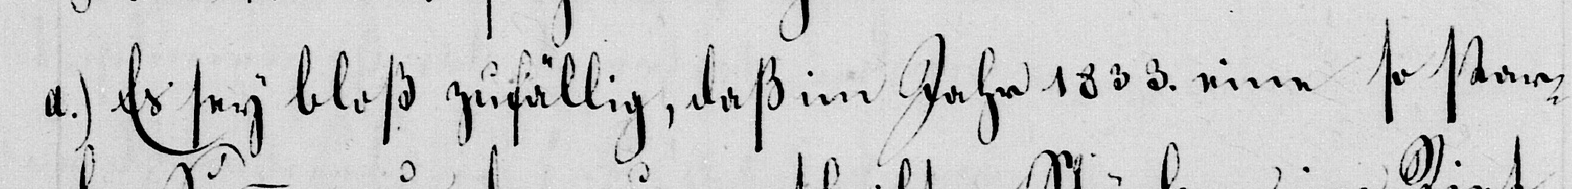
a.) Es sey bloß zufällig, daß im Jahr 1833. eine so star¬
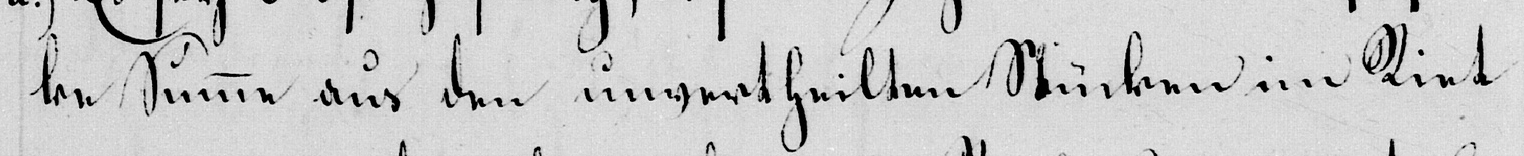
ke Summe aus den unvertheilten Stücken im Riet
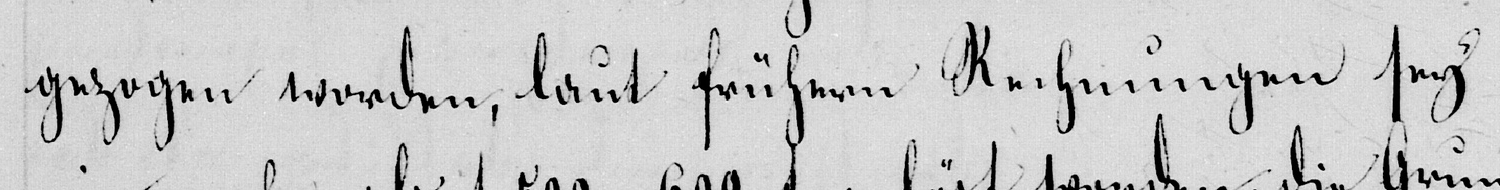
gezogen worden, laut frühern Rechnungen sey
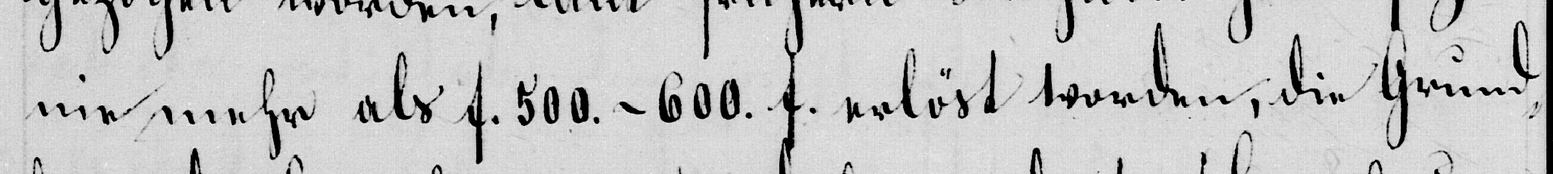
nie mehr als f. 500.–600. f. erlöst worden, die Grund¬
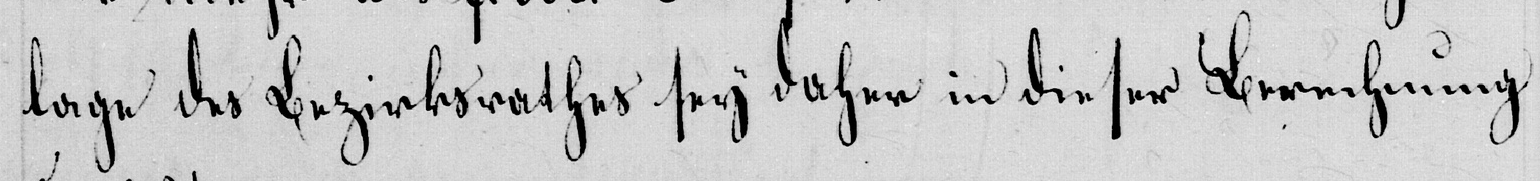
lage des Bezirksrathes sey daher in dieser Berechnung
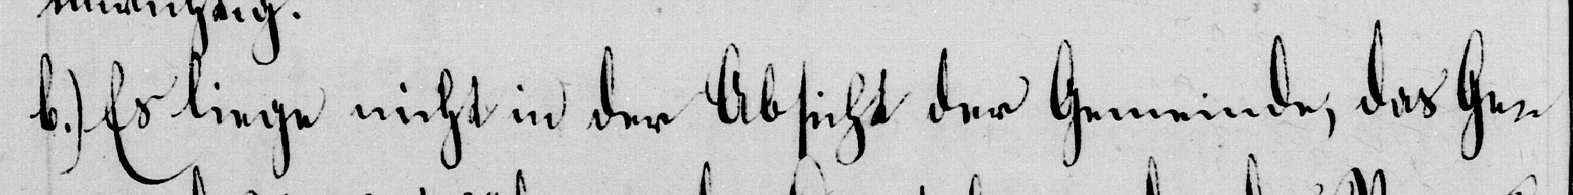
b.) Es liege nicht in der Absicht der Gemeinde, das Ge¬
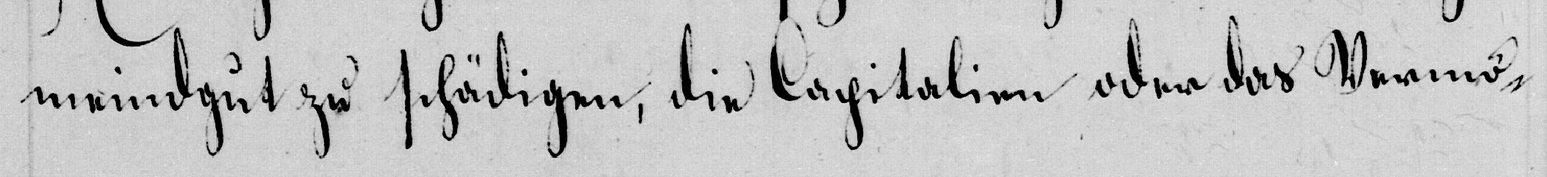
meindgut zu schädigen, die Capitalien oder das Vermö-
